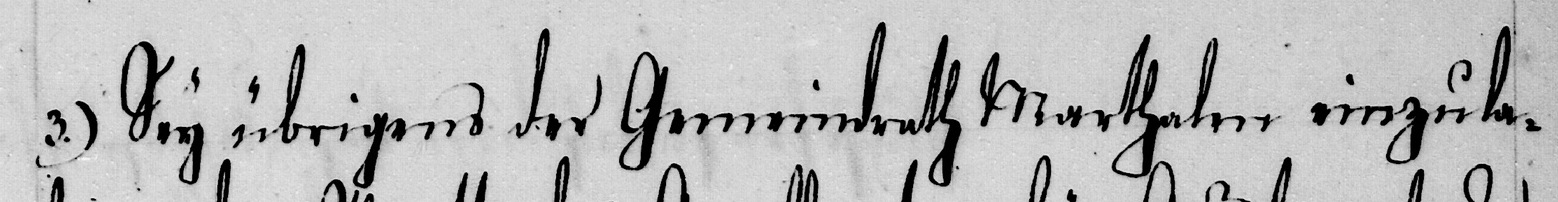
3.) Sey übrigens der Gemeindrath Marthalen einzula¬
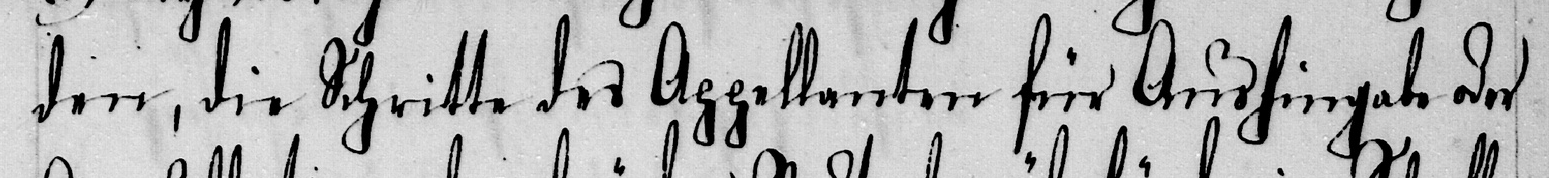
den, die Schritte des Appellanten für Aushingabe oder
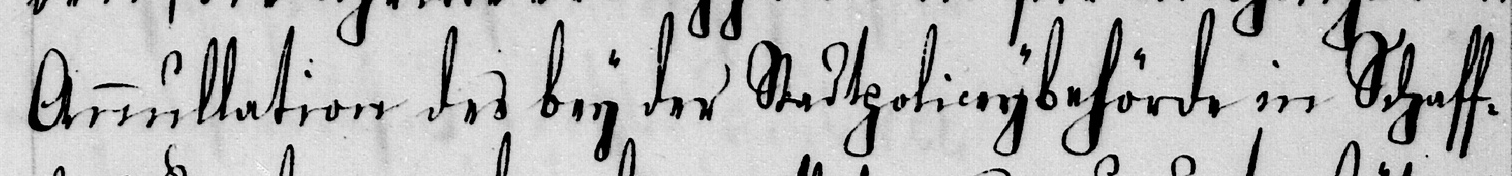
Annullation des bey der Stadtpoliceybehörde in Schaff¬
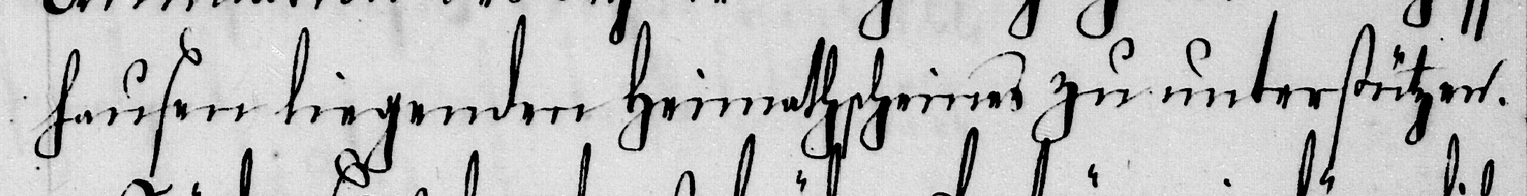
hausen liegenden Heimathscheines zu unterstützen.
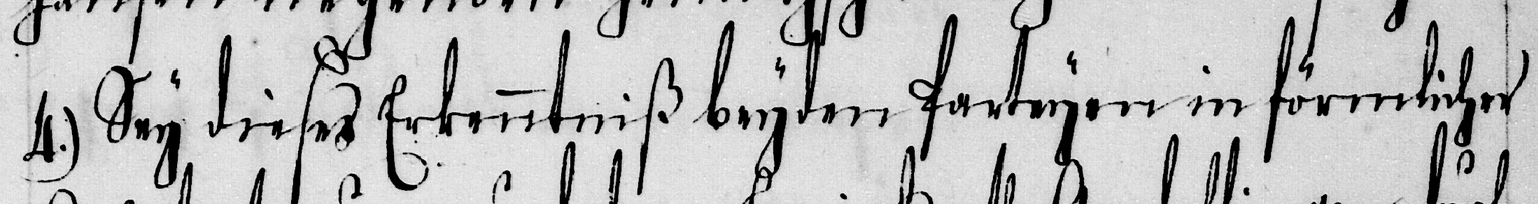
4.) Sey dieses Erkenntniß beyden Parteyen in förmlicher
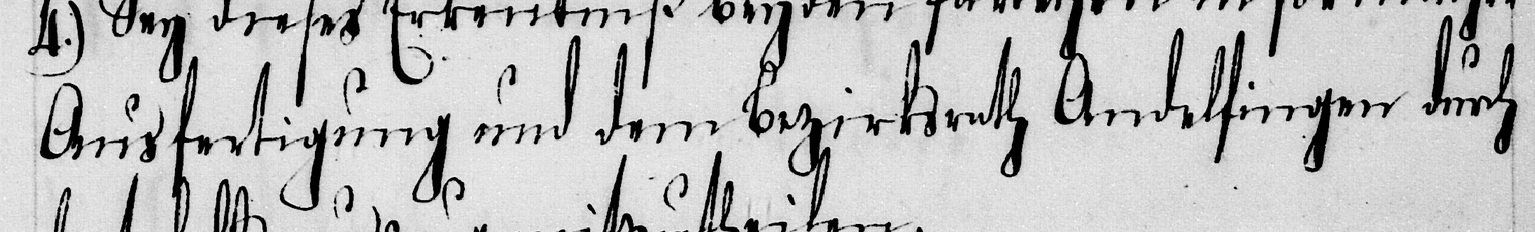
Ausfertigung und dem Bezirksrath Andelfingen durch
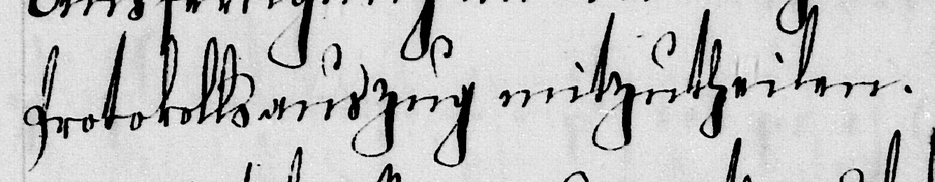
Protokollsauszug mitzutheilen.
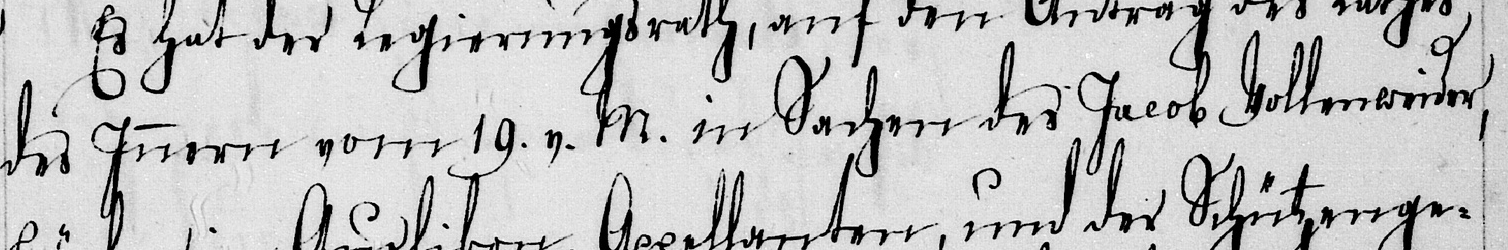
des Innern vom 19. v. M. in Sachen des Jacob Vollenweider,
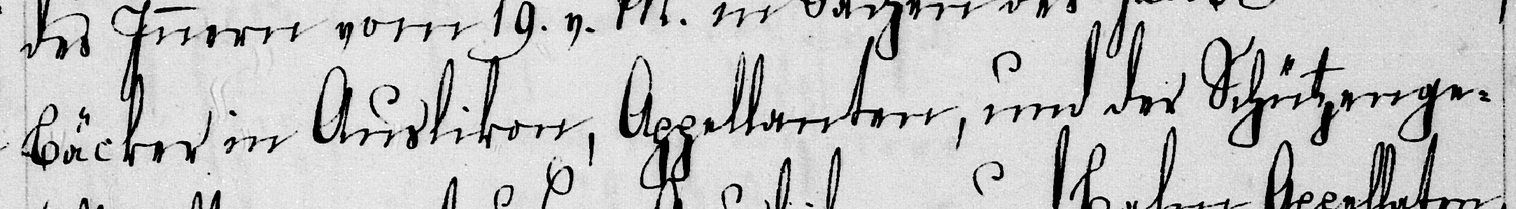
Bäcker in Auslikon, Appellanten, und der Schützengese¬
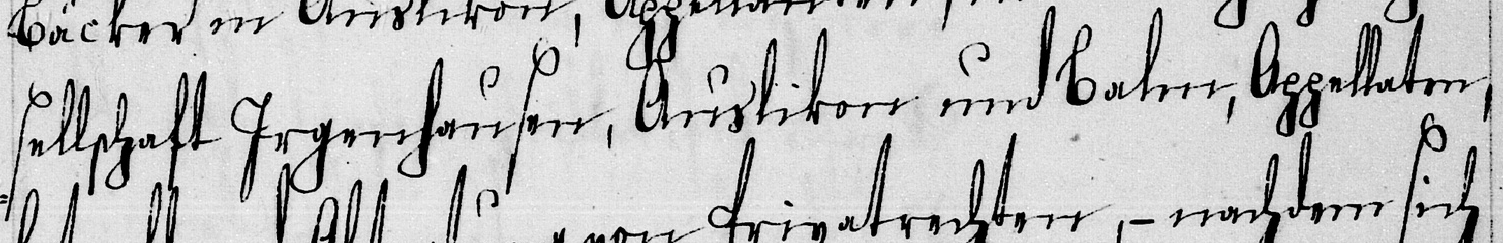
llschaft Irgenhausen, Auslikon und Balm, Appellate¬
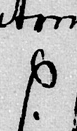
ß¬
